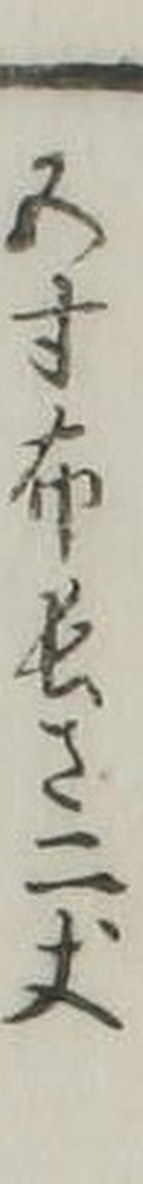五寸布長さ二丈
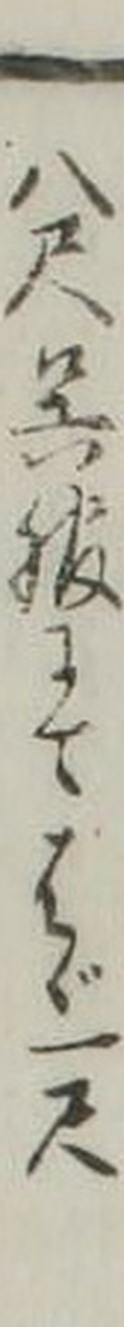八尺呉服にてはゞ一尺
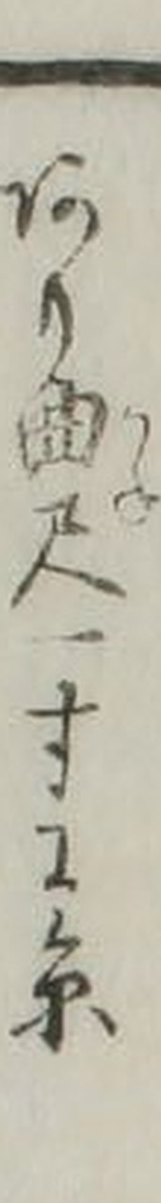あり曲尺一寸に糸
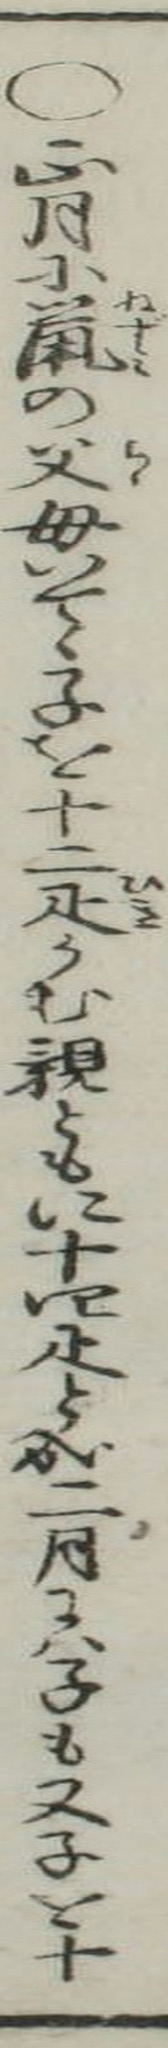○正月に鼠の父母いてゝ子を十二疋うむ親ともに十四疋と成二月には子も又子を十
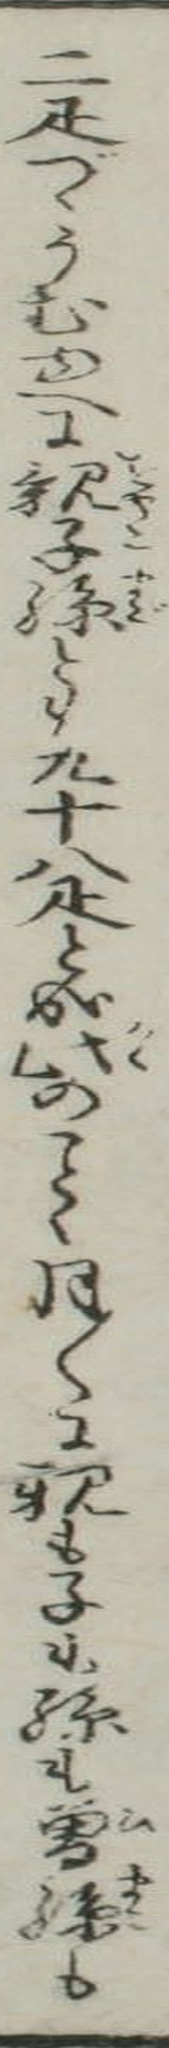二疋づゝうむゆへに親子孫とも九十八疋と成此のことく月〳〵に親も子も孫も曽孫も
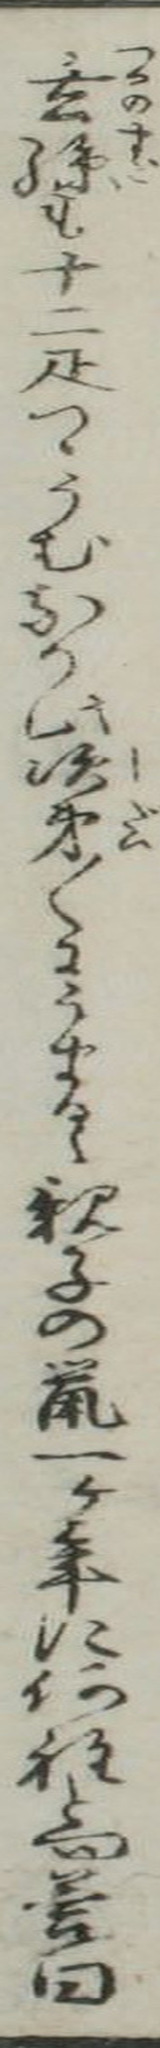玄孫も十二疋つゝうむなり此次第〳〵にうまるゝ親子の鼠一ヶ年に何程と問答曰

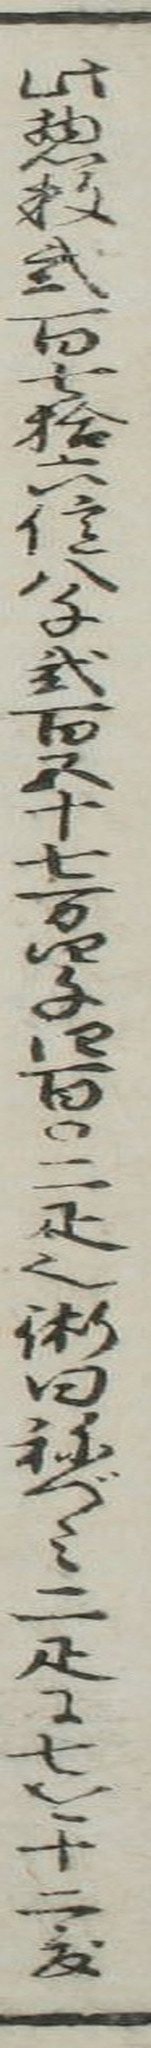此惣数弐百七拾六億八千弐百五十七万四千四百〇二疋也術曰ねずみ二疋にて七を十二度
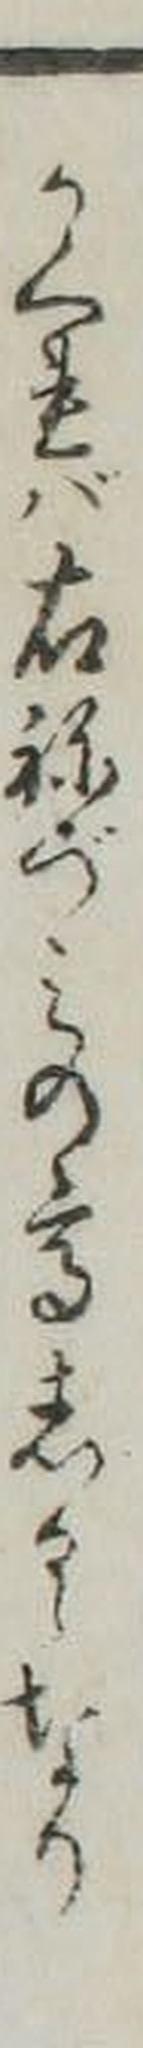かくれば右ねずみの高しるゝなり
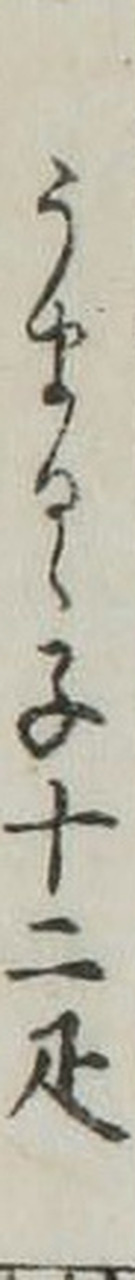うまるゝ子十二
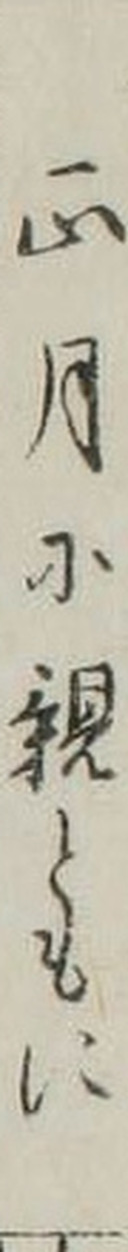正月に親ともに
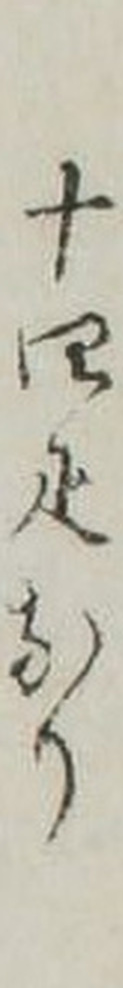十四疋なり
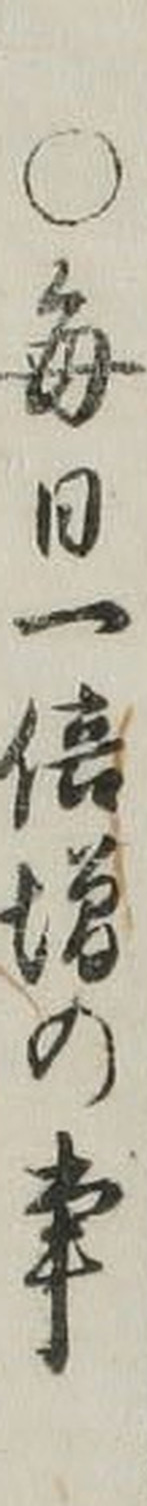○毎月一倍増の事
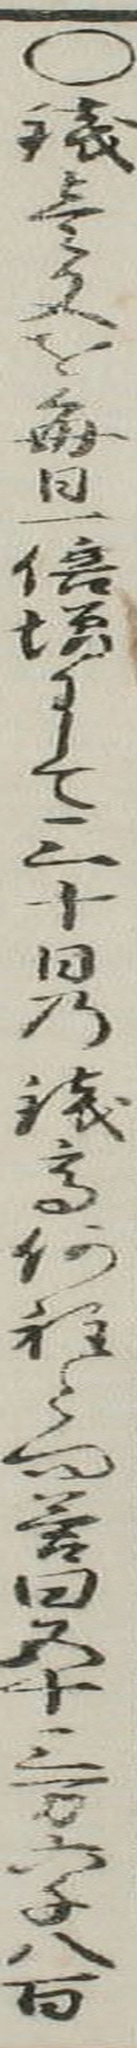○銭壱文を毎日一倍増にして三十日の銭高何程と問答曰五十三万六千八百
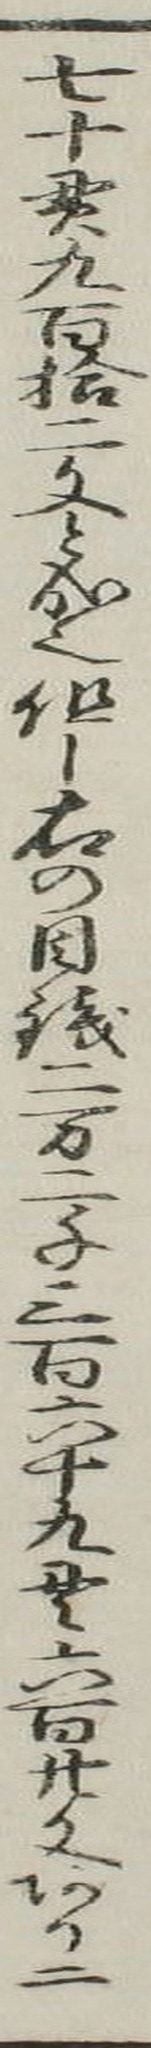七十貫九百拾二文と成也但し右の目銭二万二千三百六十九貫六百廿文あり二
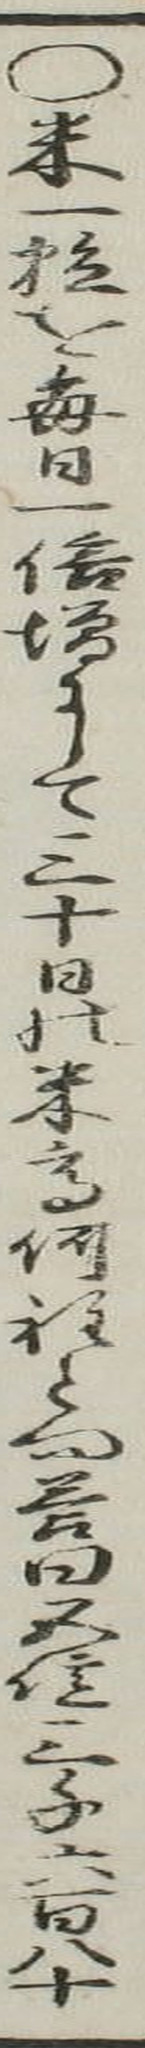○米一粒を毎日一倍増にして三十日の米高何程と問答曰五億三千六百八十
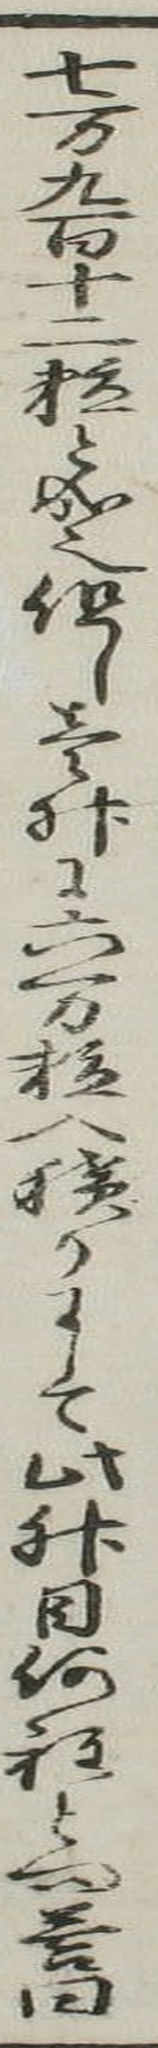七万九百十二粒と成也但し壱升に六万粒積りにして此升目何程と問答曰
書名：宝玉塵劫記
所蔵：東京学芸大学教育コンテンツアーカイブ
